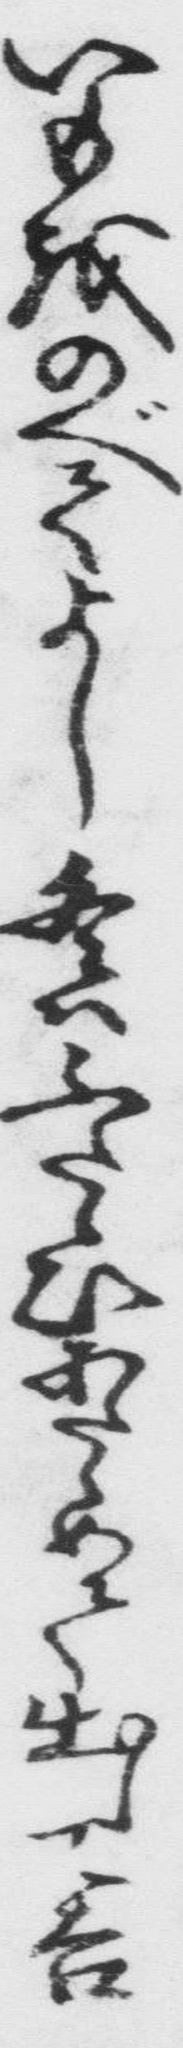いもをのべてよし冬はふたゝひあたゝめて出して吉
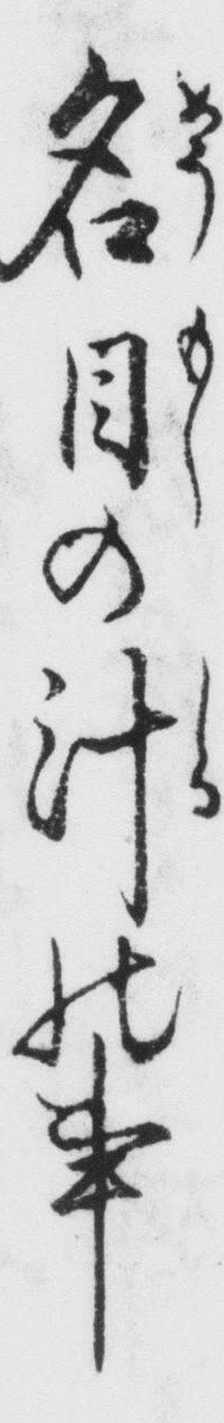名目の汁の事
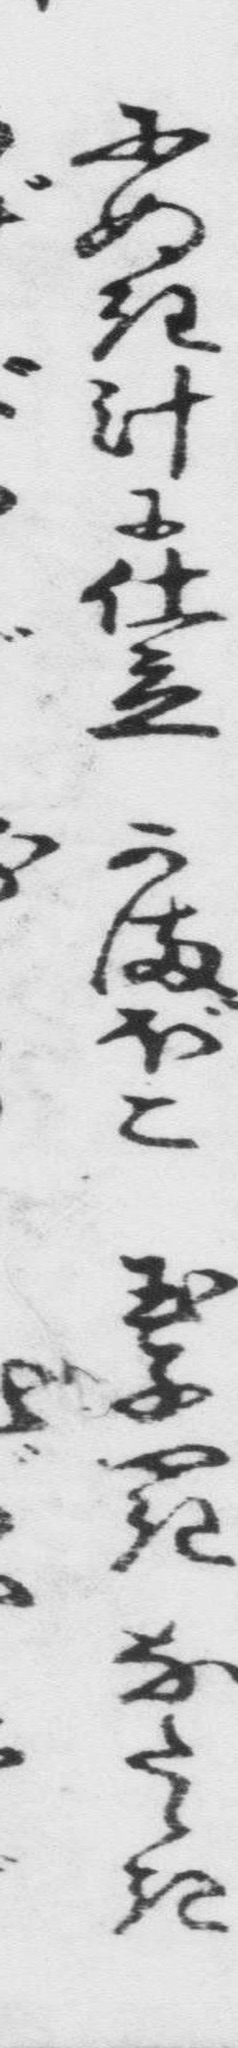にぬき汁に仕立かまぼこ玉子やきなたゝき
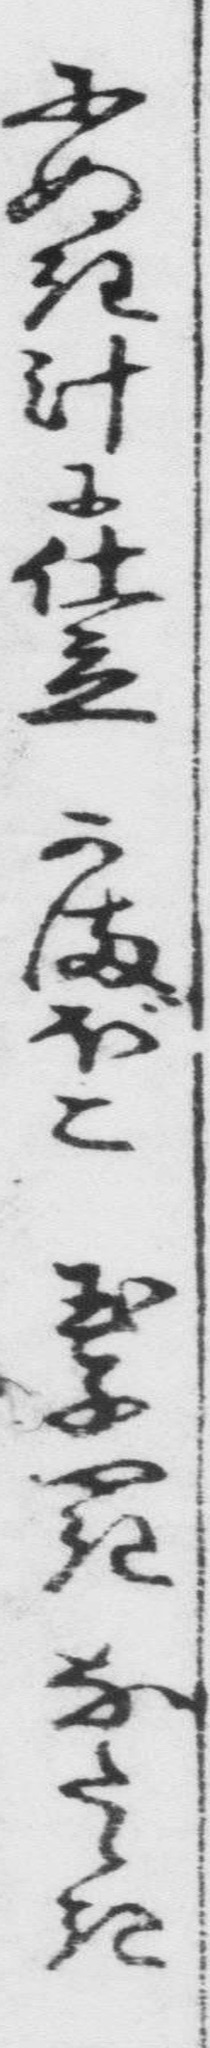にぬき汁に仕立かまぼこ玉子やきなたゝき
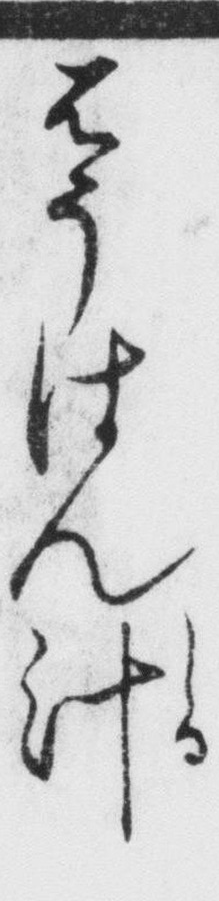はうはん汁
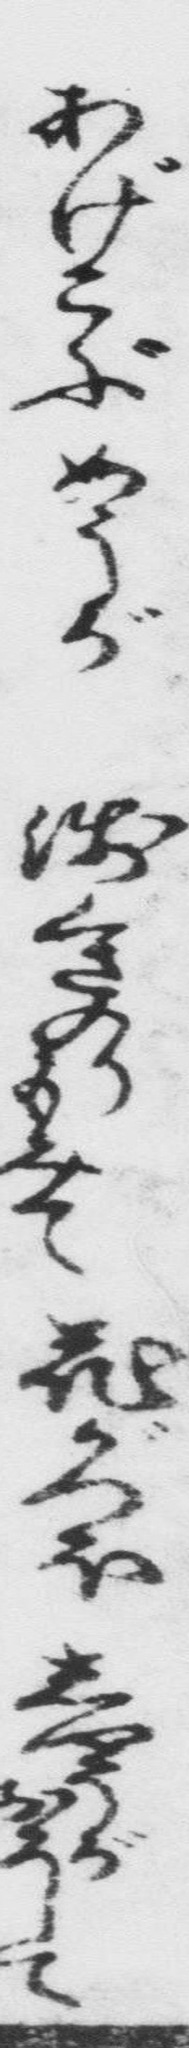あげこぶめうが浅くさのりもみて花がつほしやうがおろし
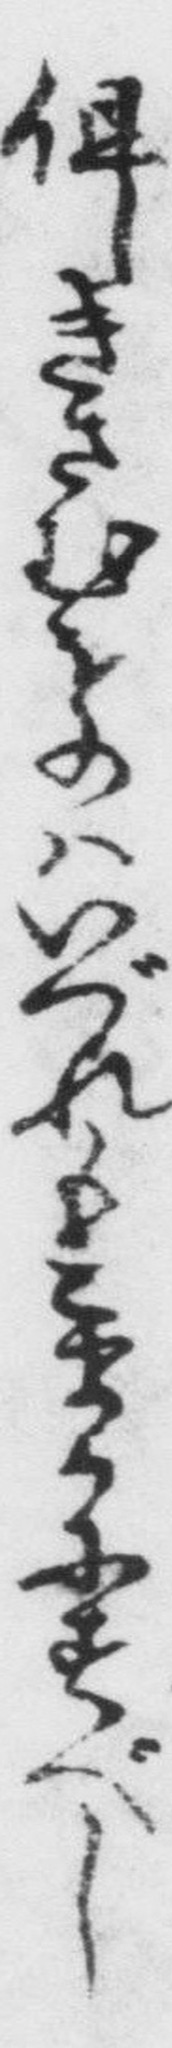但しきさむものはいづれもこまかにすべし
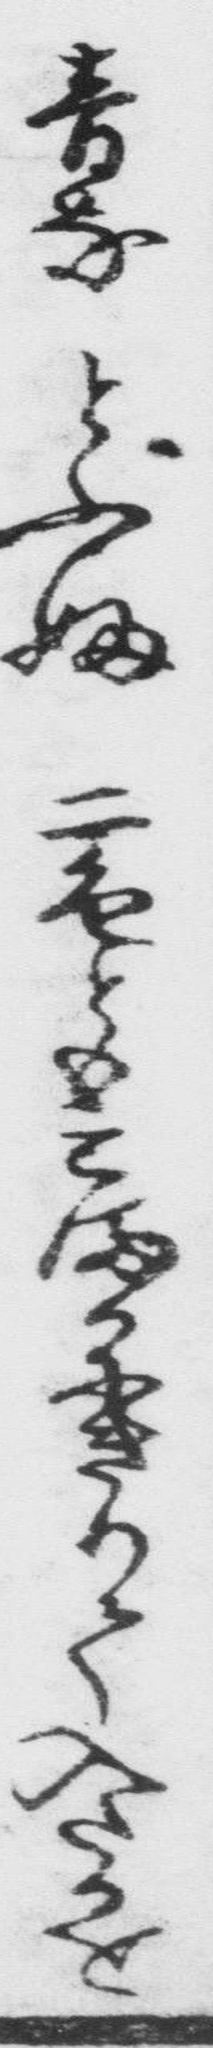青なとふふ二色ともこまかにきりて入たるを
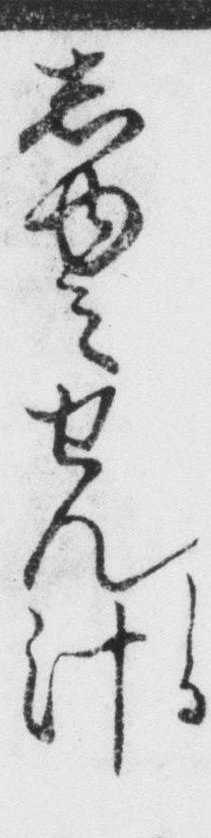しゆみせん汁
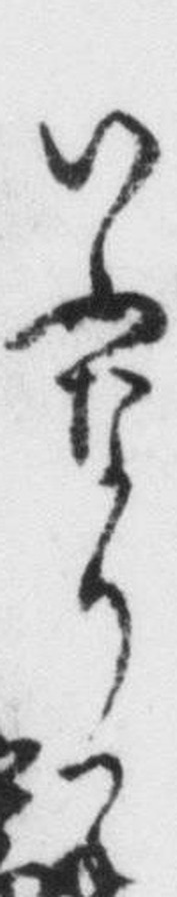いふなり
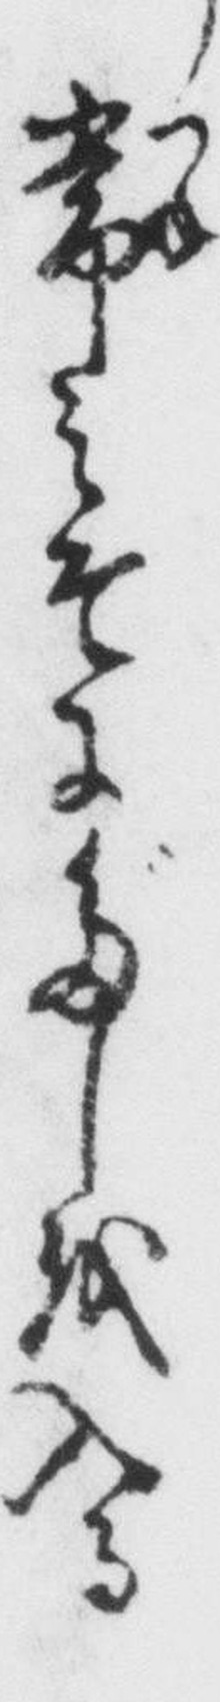常みそにたしを入る
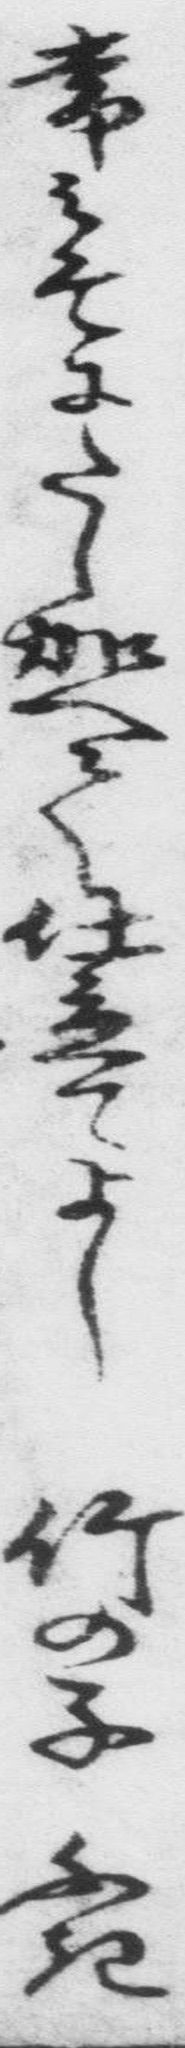常みそにたし加へて仕立てよし竹の子ふき
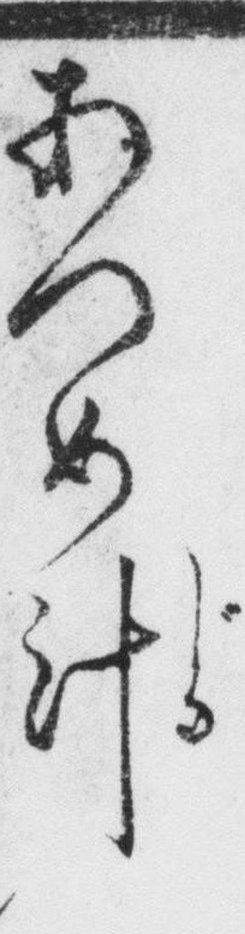あつめ汁
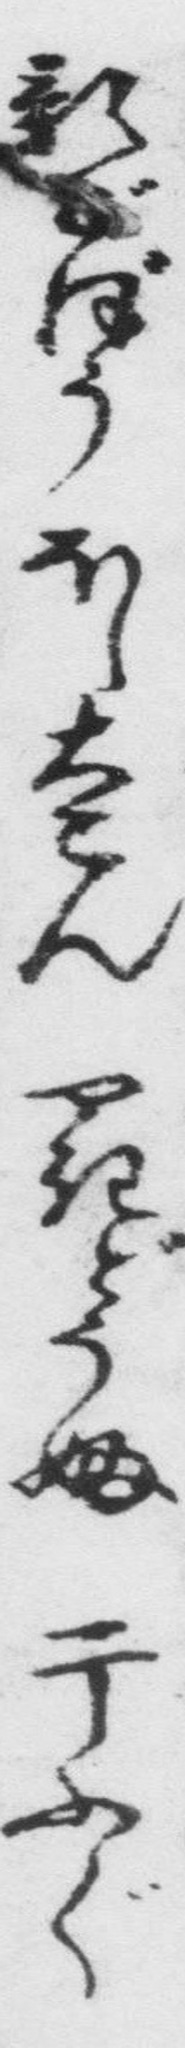新ごぼうほし大こんやきどうふ干ふぐ
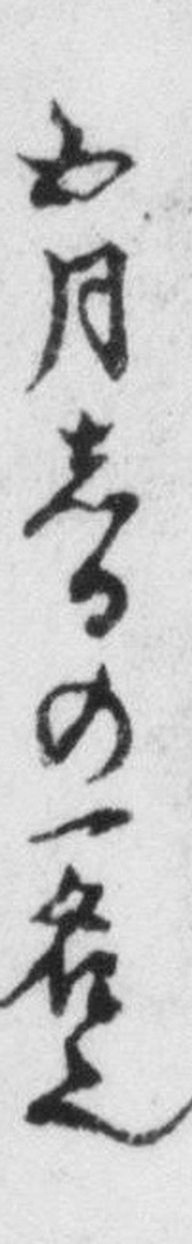五月しるの一名也
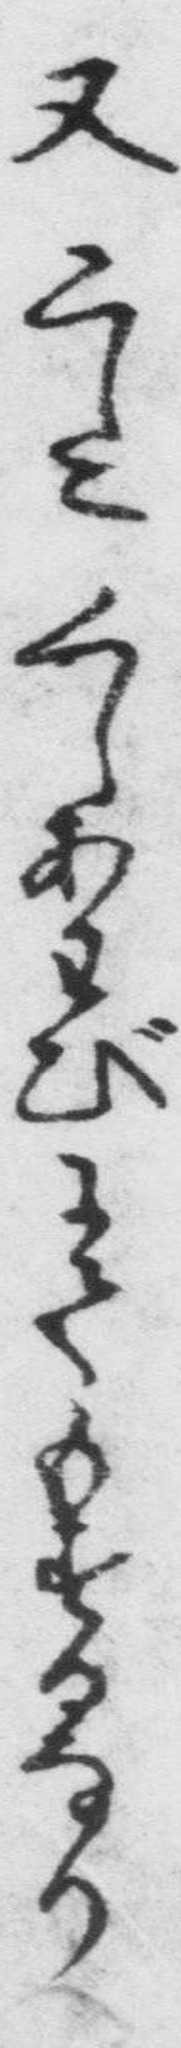又くしこくしあわびにてもするなり
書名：料理早指南
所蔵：大阪府立大学学術情報センター 国文学研究資料館
